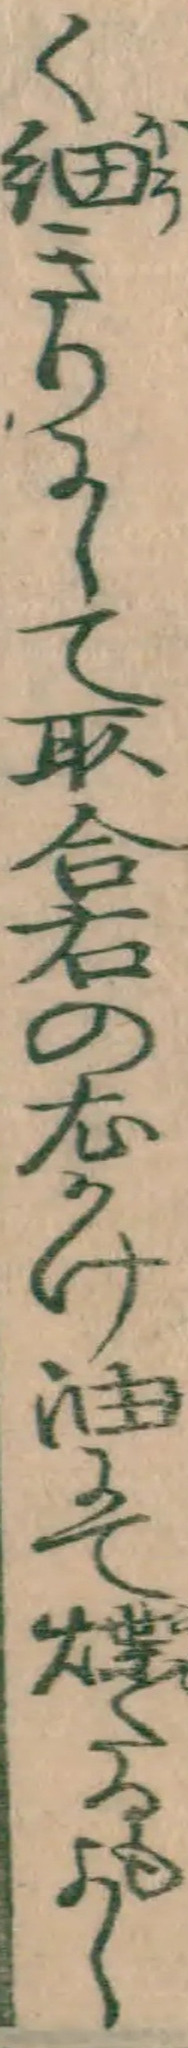く細きりにして取合右の尤かけ油にて煠たるもよし
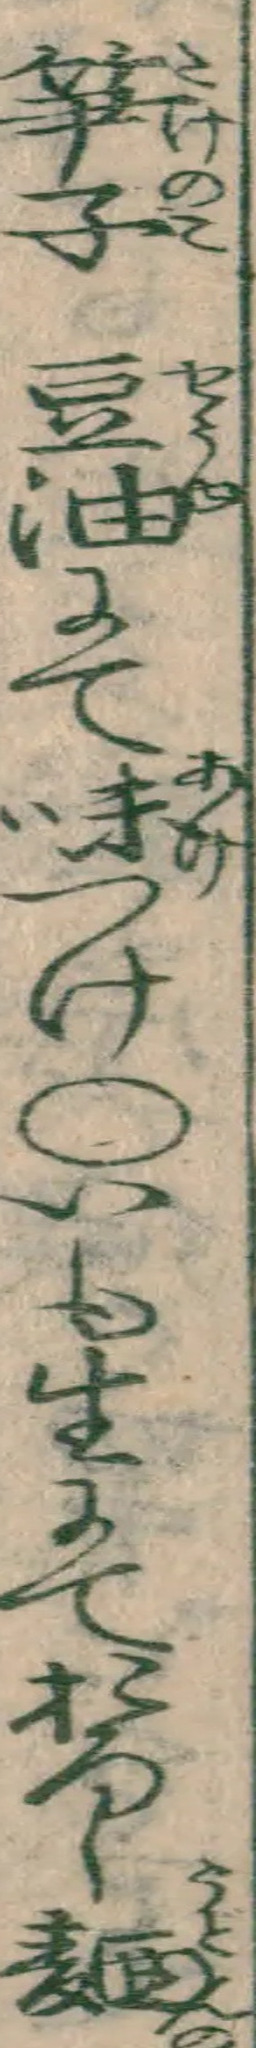笋子豆油にて味つけ○いも生にておろし麺
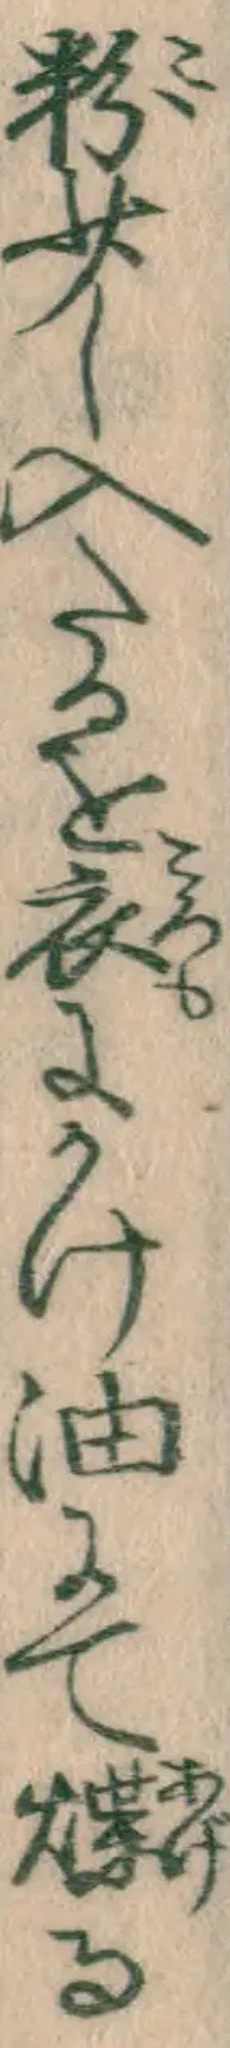粉少し入たるを衣にかけ油にて煠る
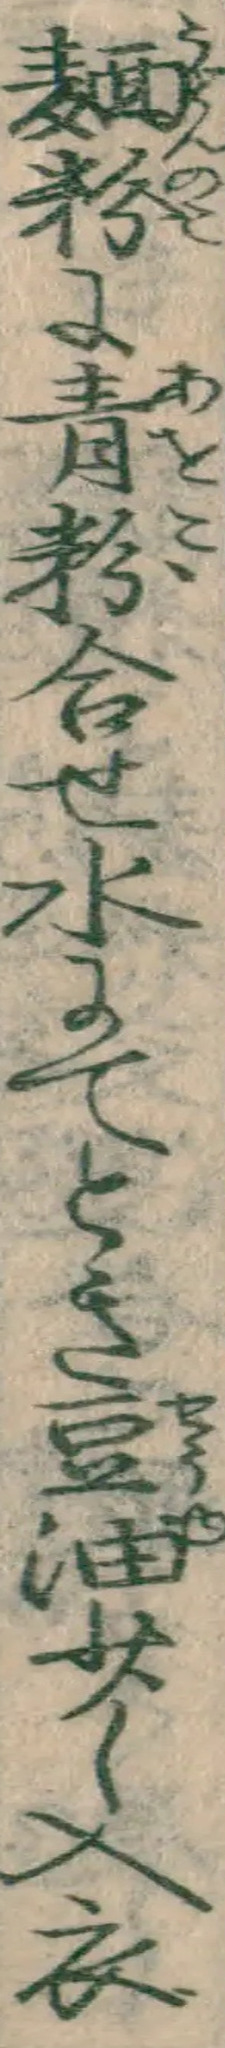麺粉に青粉合せ水にてとき豆油少し入衣
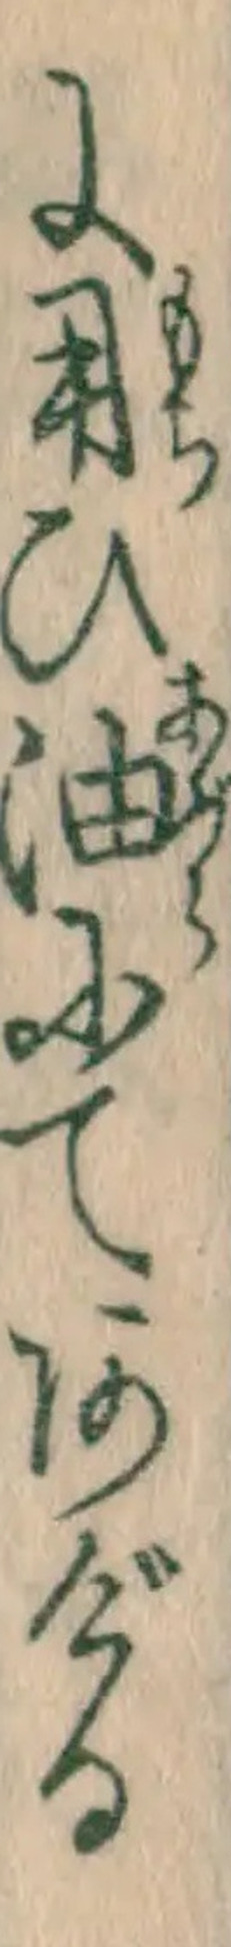に用ひ油にてあげる

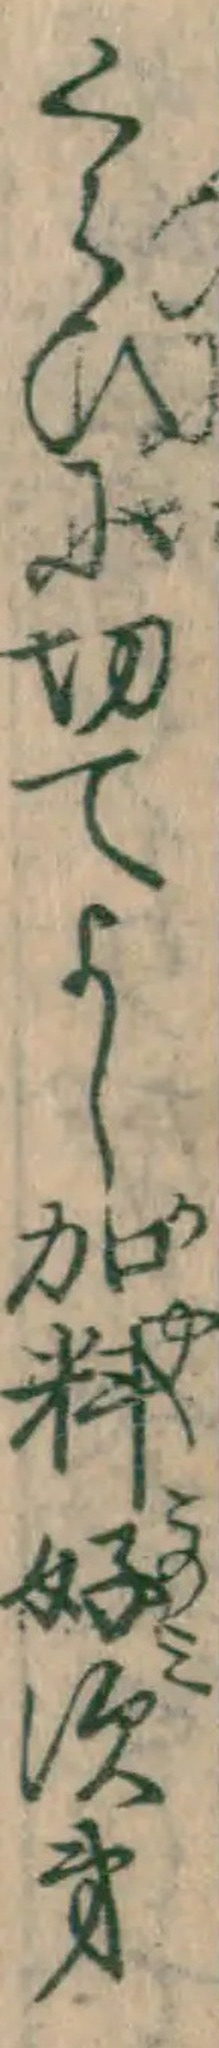くらひに切てよし加料好次第
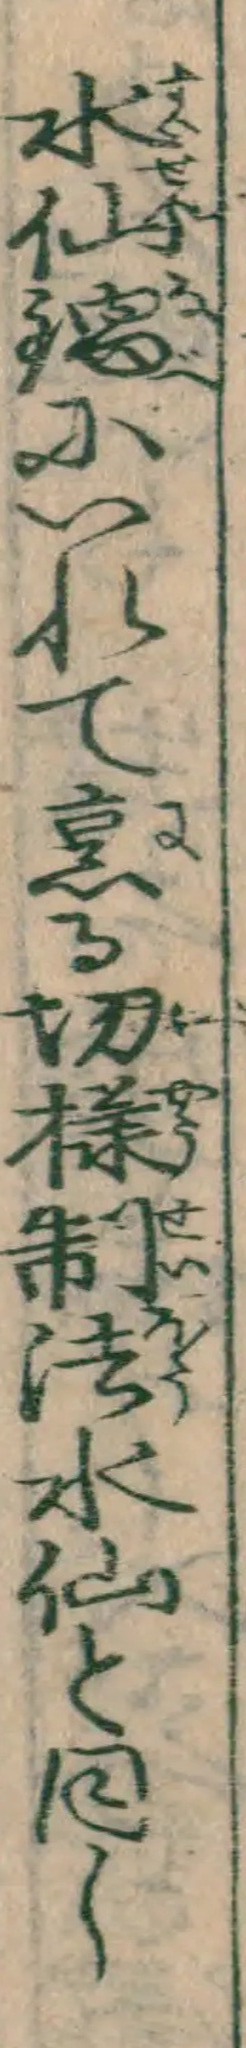水仙鍋にいれて烹る切様制法水仙と同し
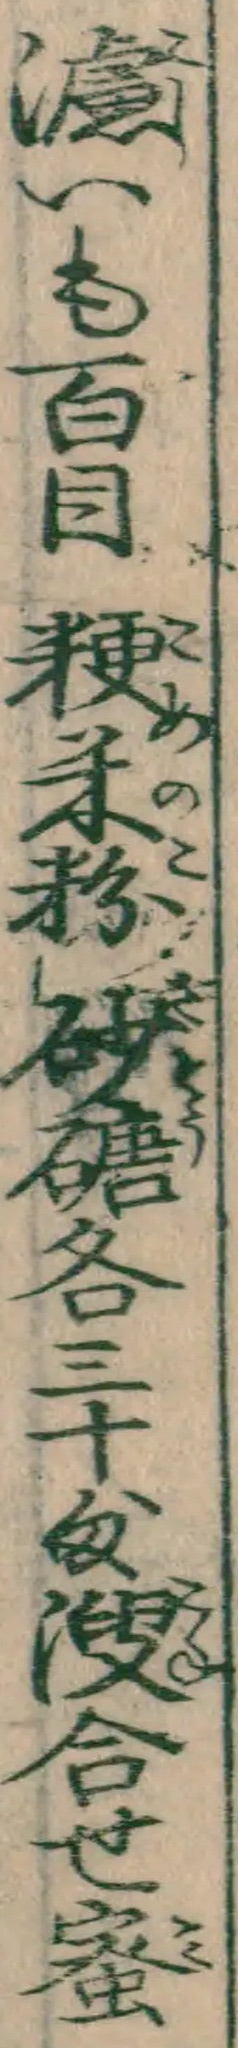濾いも百目粳米粉砂磄各三十匁溲合せ蜜
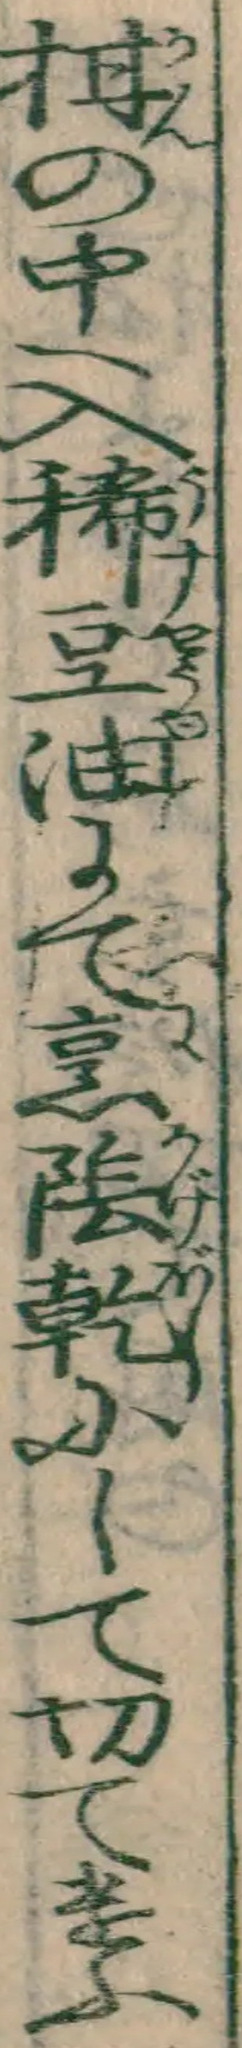柑の中へ入稀豆油にて烹陰乾にして切て遣ふ
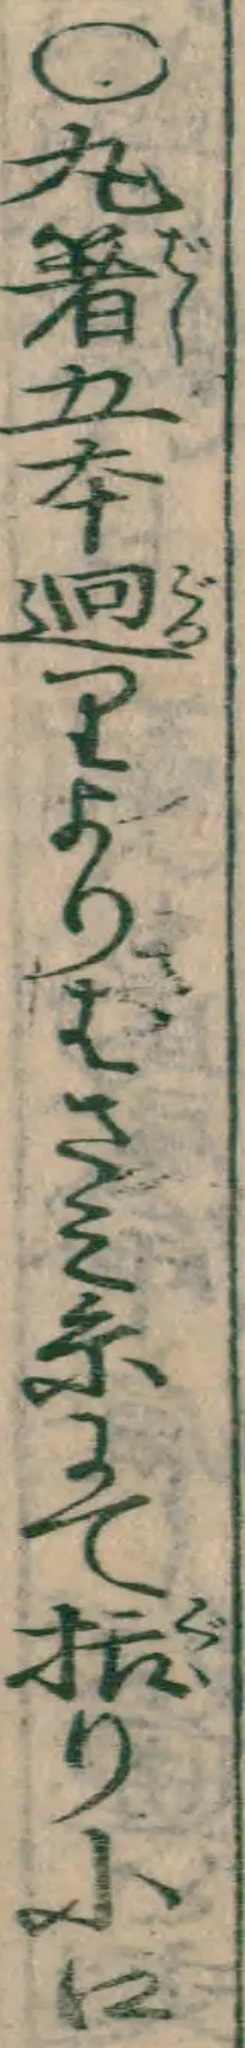○丸箸五本廻りよりはさみ糸にて括り小口
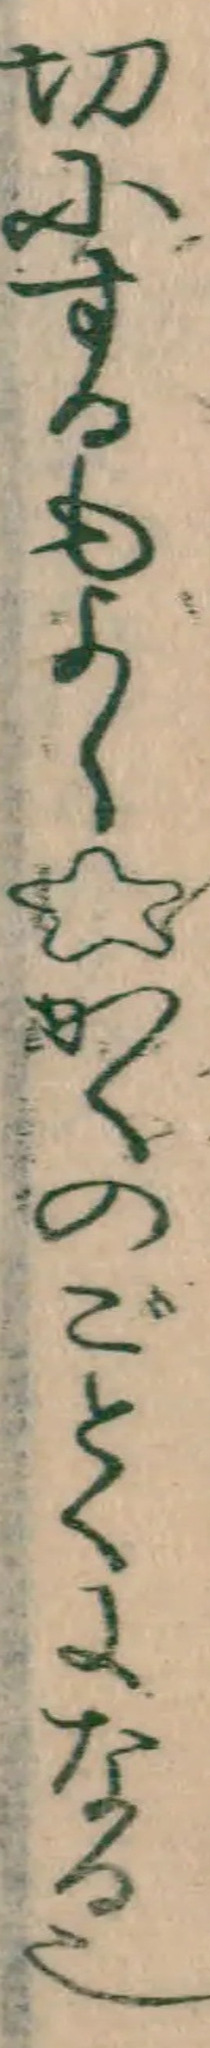切にするもよし☆かくのごとくになる也
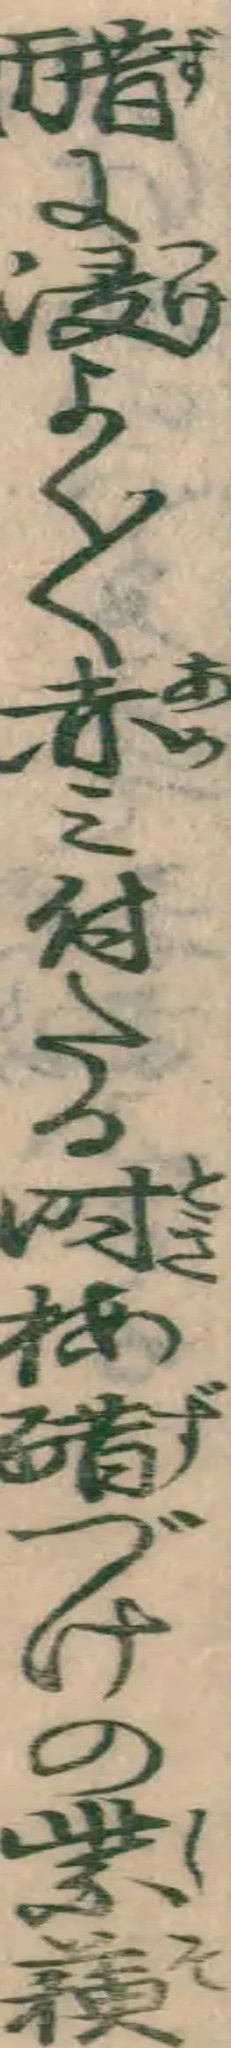醋に浸よく〳〵赤み付たる時梅醋づけの紫蘇
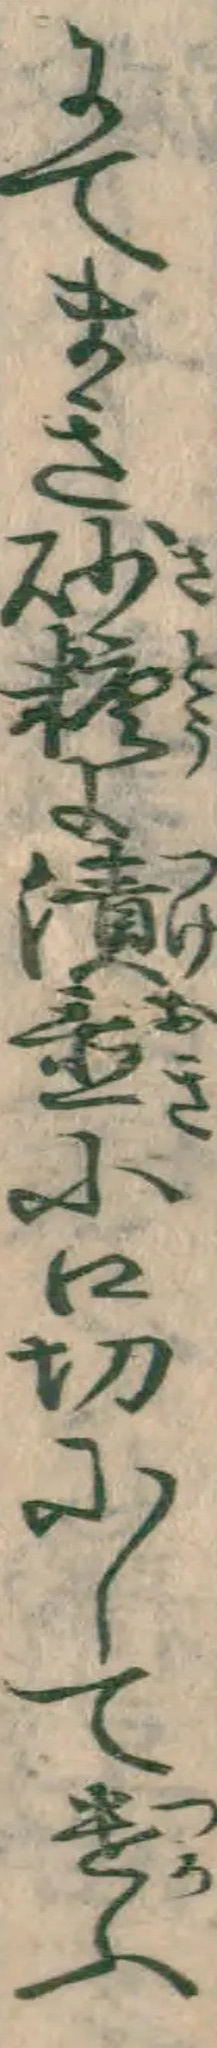にてまき砂糖に漬置小口切にして遣ふ
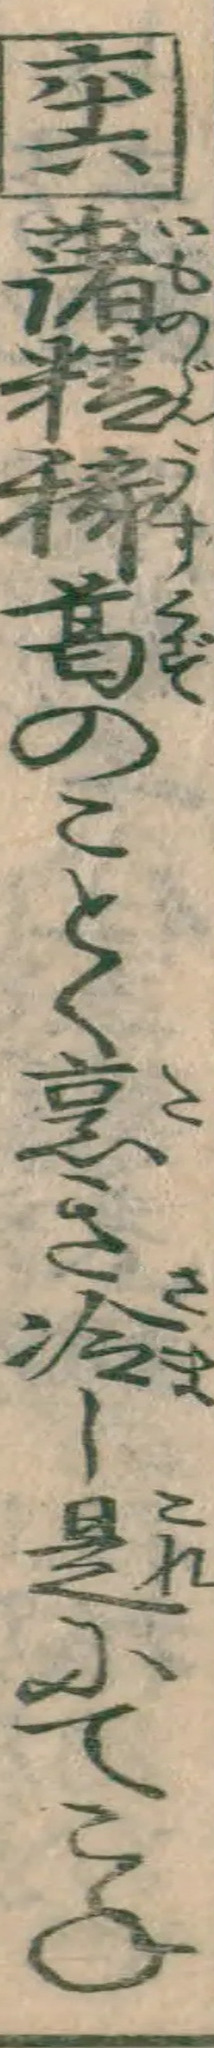[六十六]藷精稀葛のことく烹き冷し是にてこね
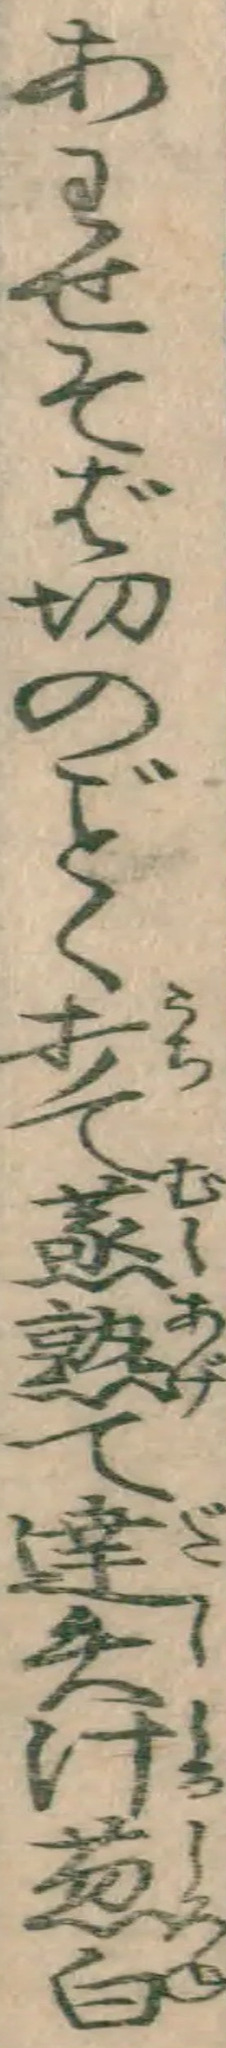あわせそば切のごとく打て蒸熟て達矢汁葱白
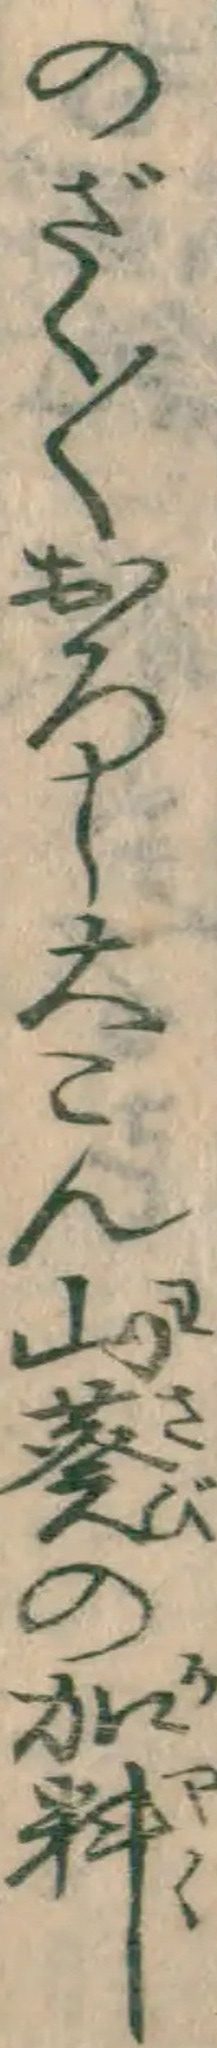のざく〳〵おろし大こん山葵の加料
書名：甘藷百珍
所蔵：国立国会図書館 National Diet Library, JAPAN
